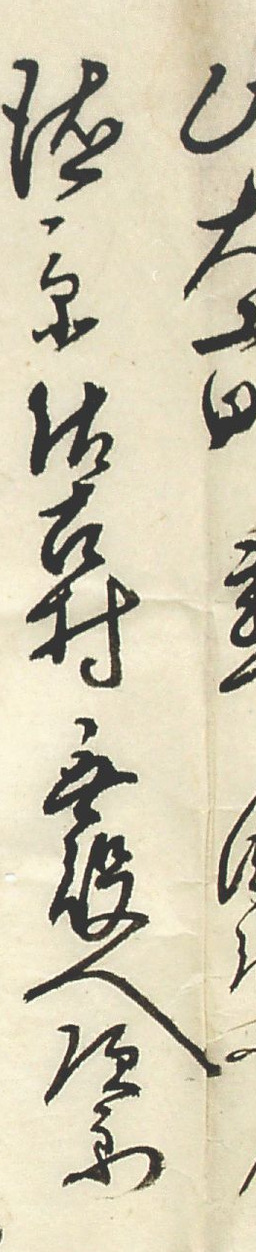徳兵衛佐古村無役人次兵衛
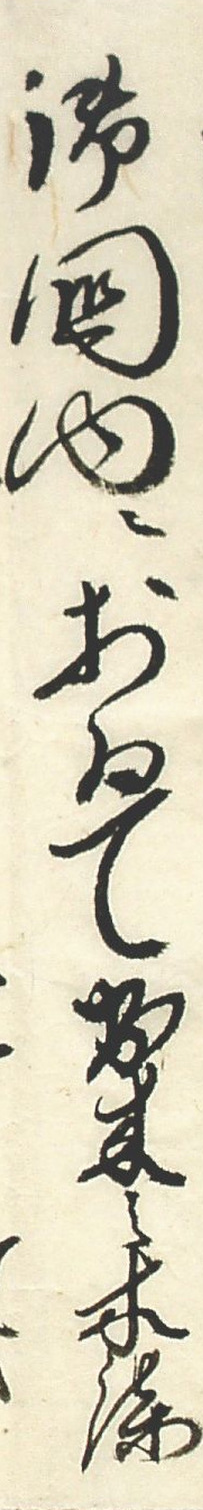御国内におゐて出来候木漆
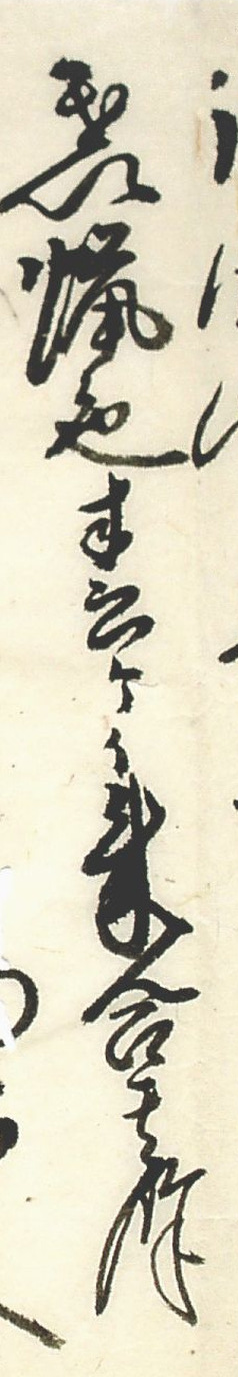を以蝋色等春ケイ朱合其余
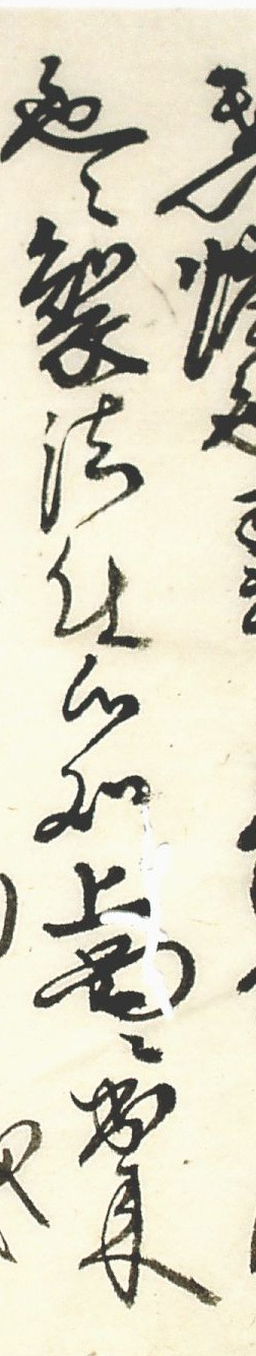色々製法仕候処上図に出来
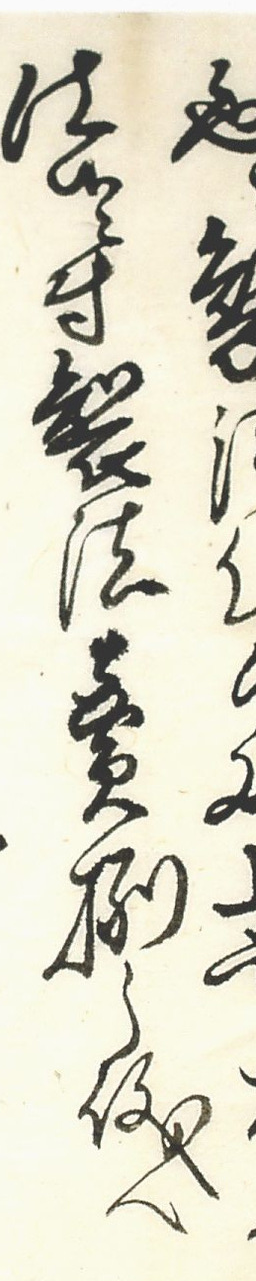仕候に付製法売捌之儀被
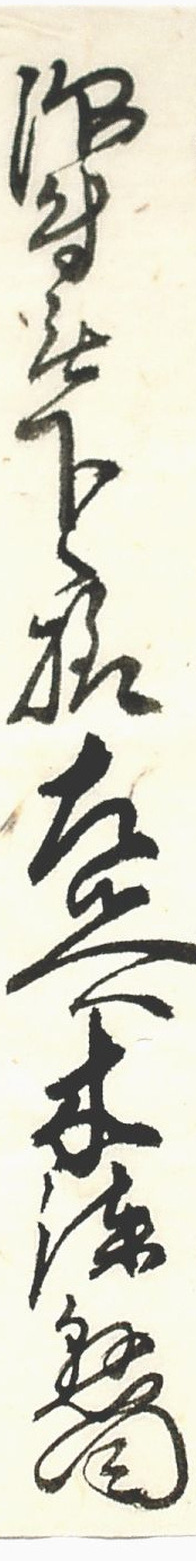仰付被下候様左候へは木漆懸目
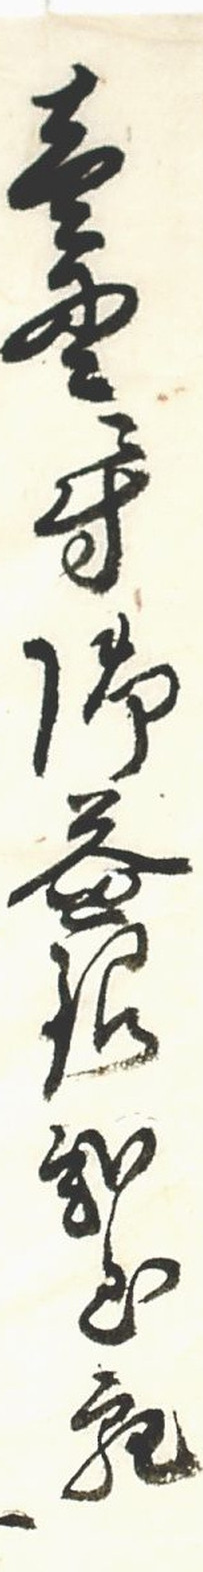壱貫に付御益銀弐匁宛
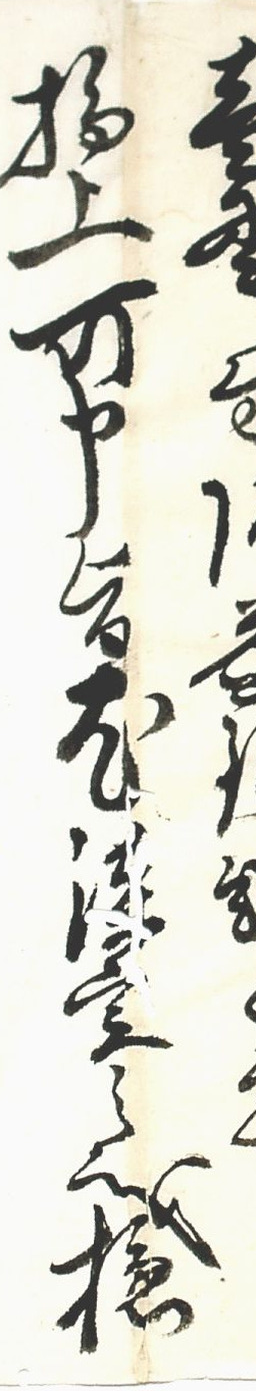指上可申上旨尤漆実之義櫨
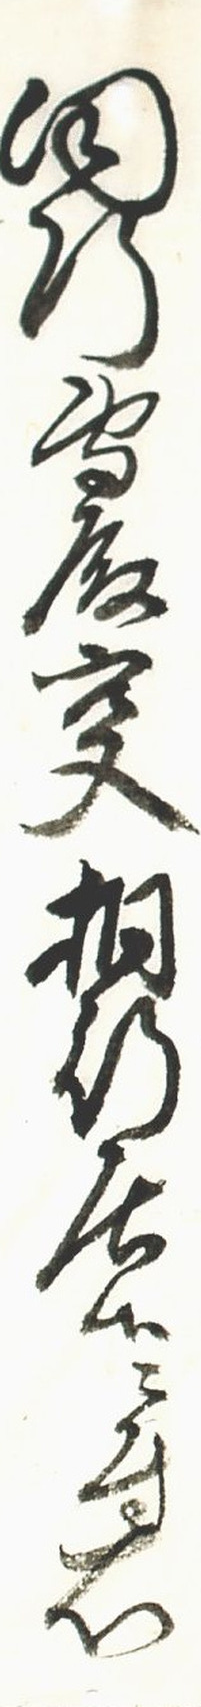同断専取交相行居候に付右
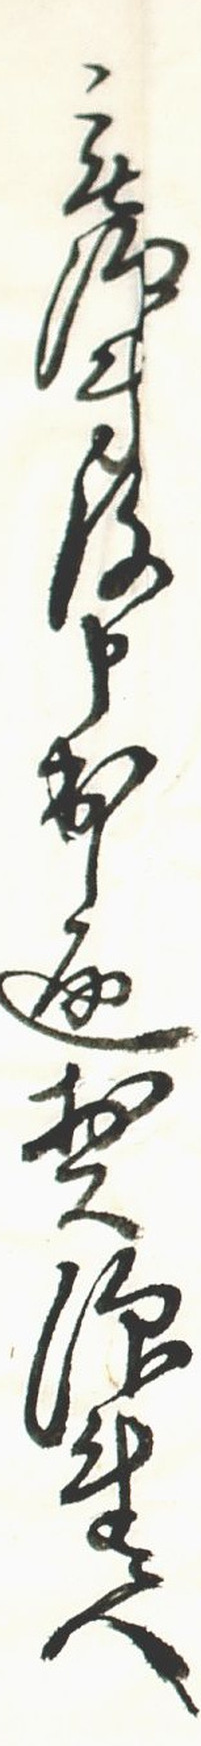被仰付度申出候通於被仰付には
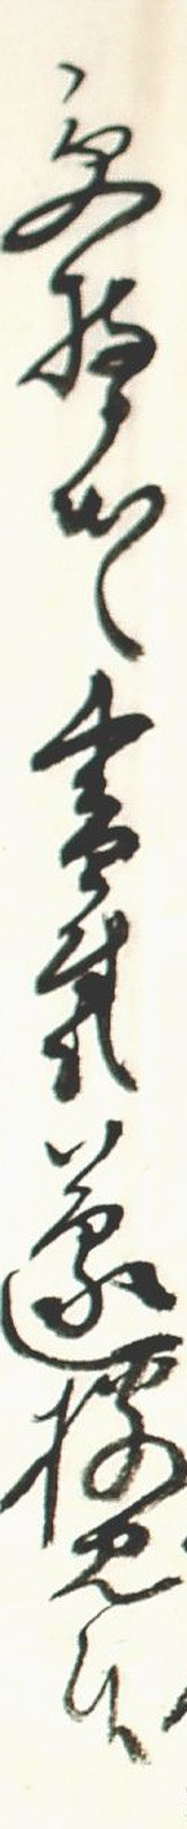受持申出候書付被遂披見候
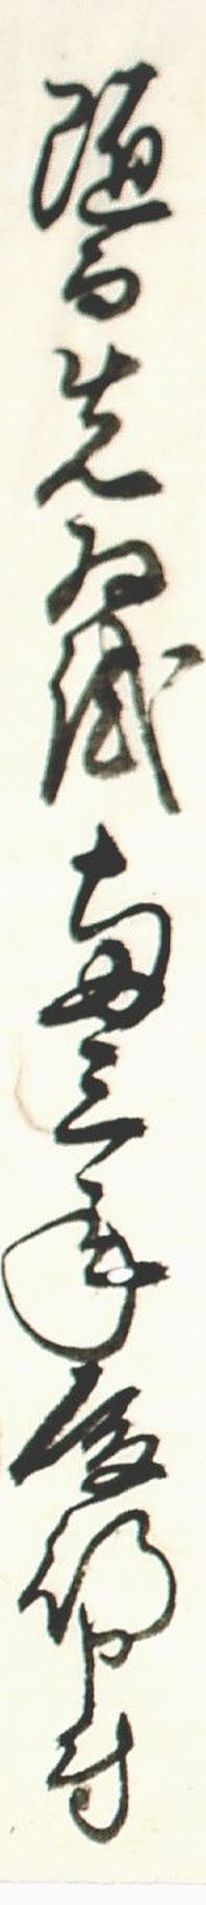随而先為試両三年取行申付
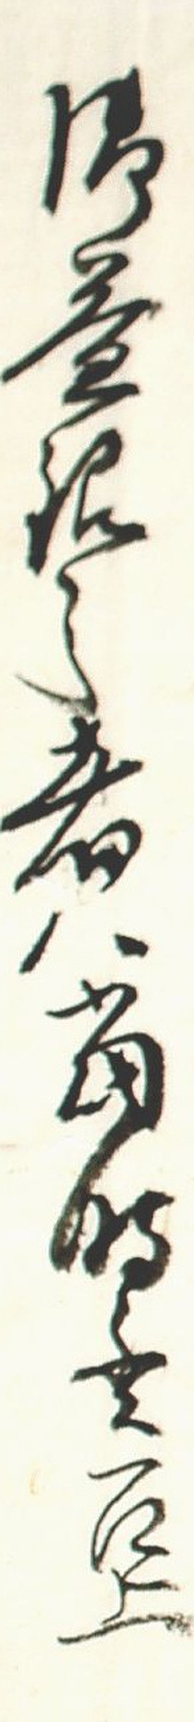御益銀之者は当時不被召上
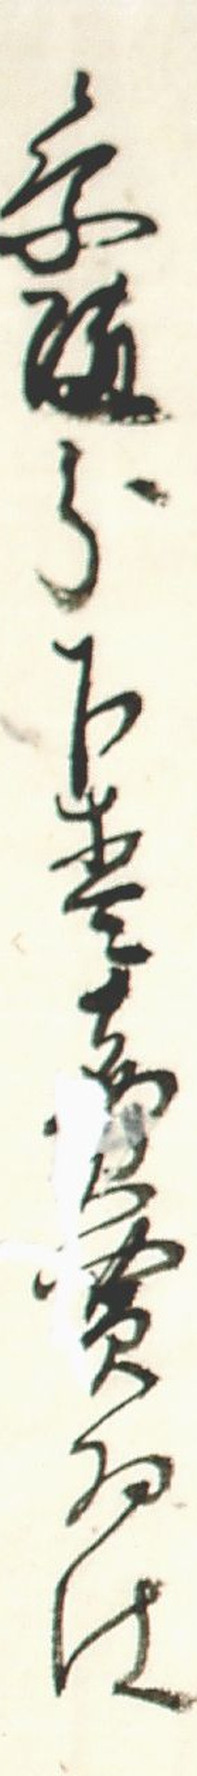候条随分下直に売買為仕
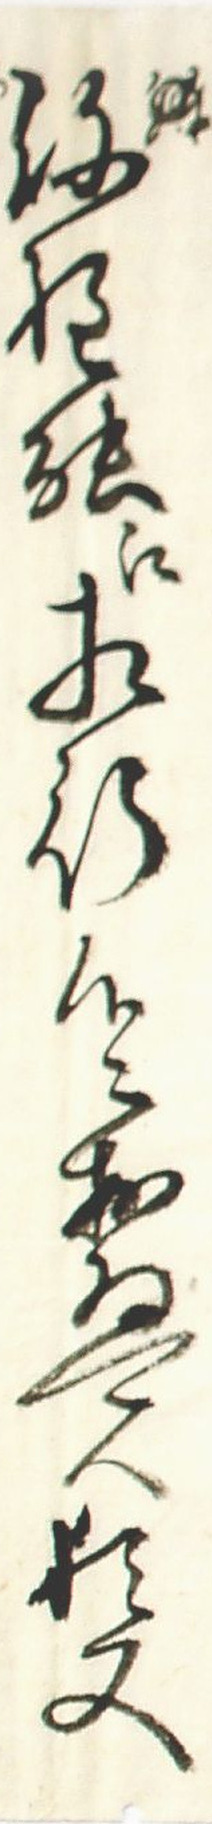弥程能被相行候におゐては猶又
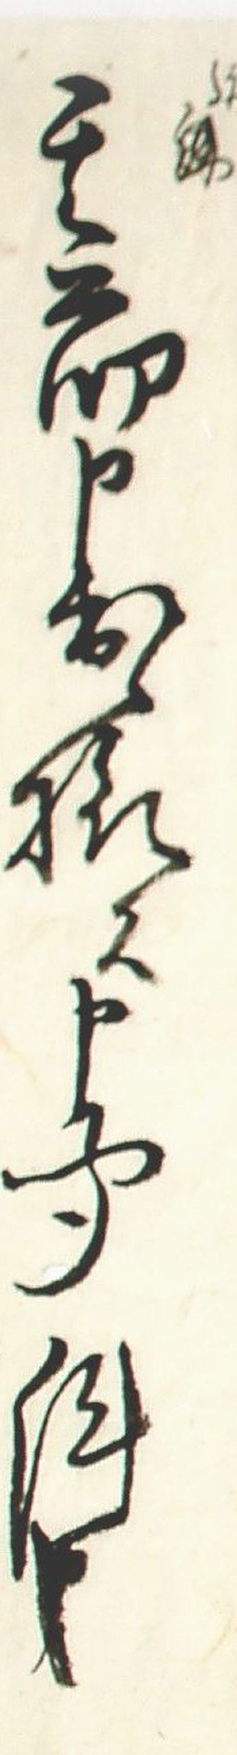其節申出候様被申聞件之
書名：申上覚（漆からろう製成及売捌きについて）
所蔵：鳴門教育大学 Naruto University of Education
